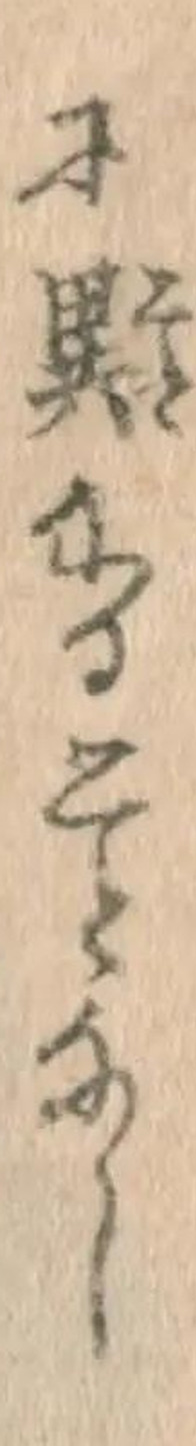に異なることなし
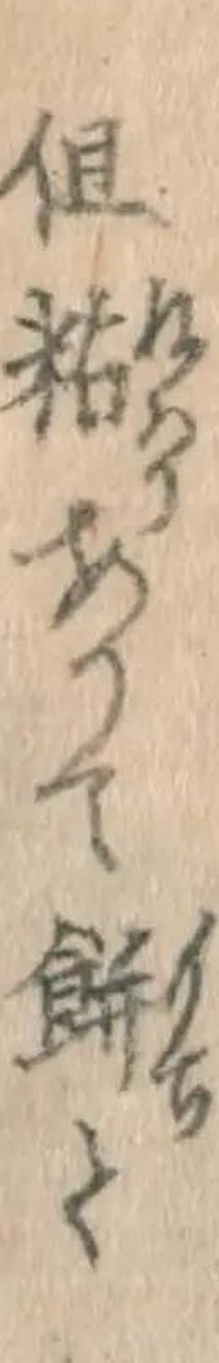但粘ありて餅と
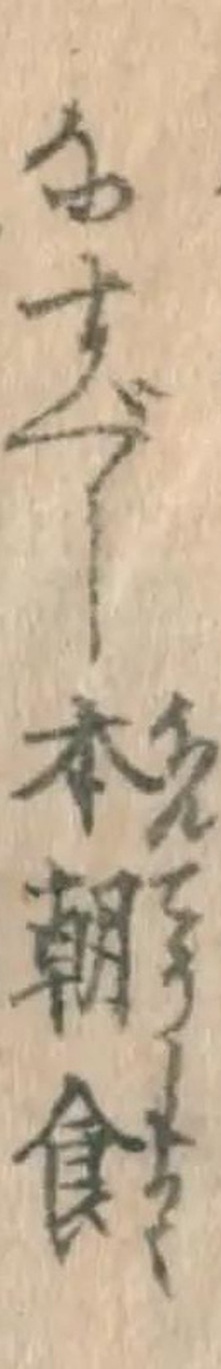なすべし本朝食
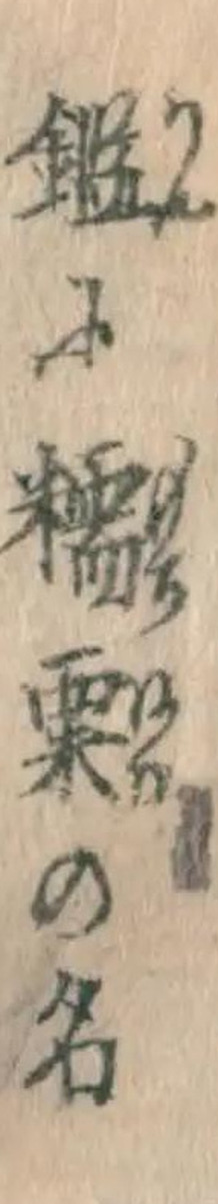鑑に糯粟の名
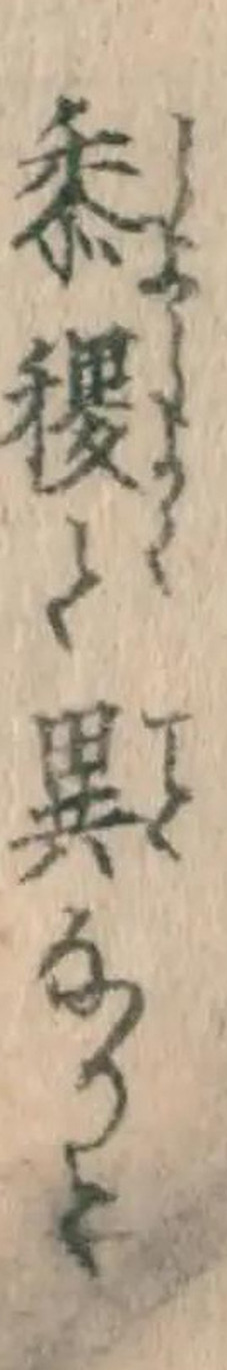黍稷と異なりと
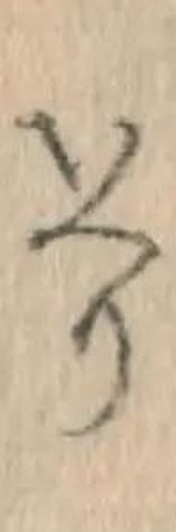いへり

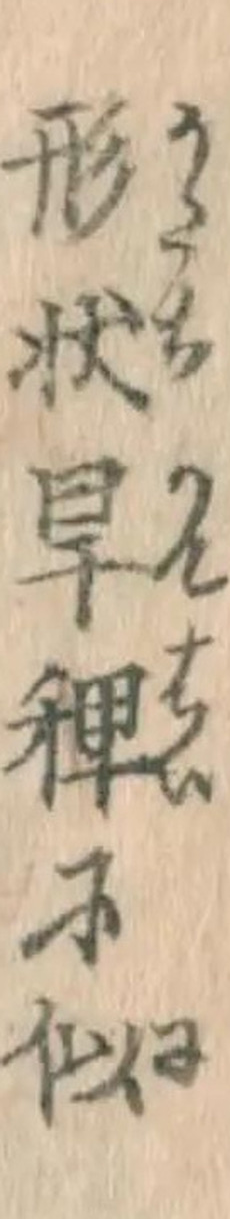形状旱稗に似
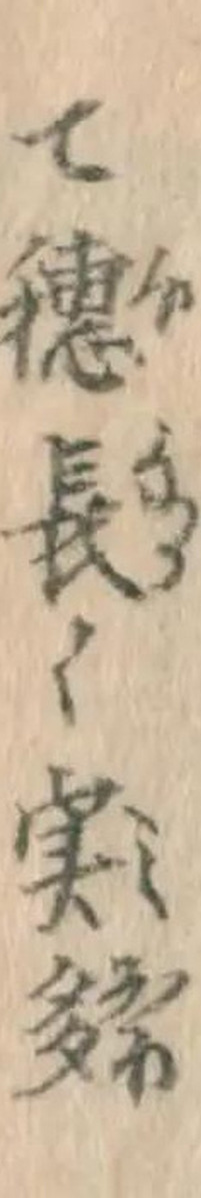て穂長く実多
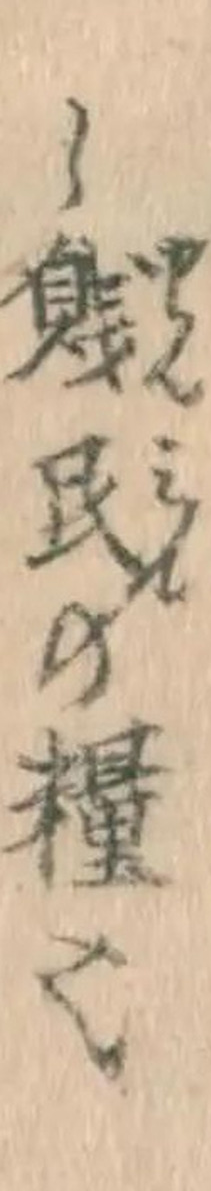し賤民の糧也

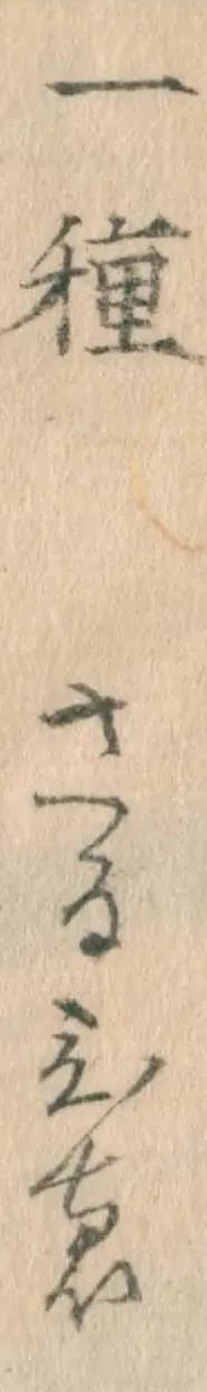一種さるひゑ
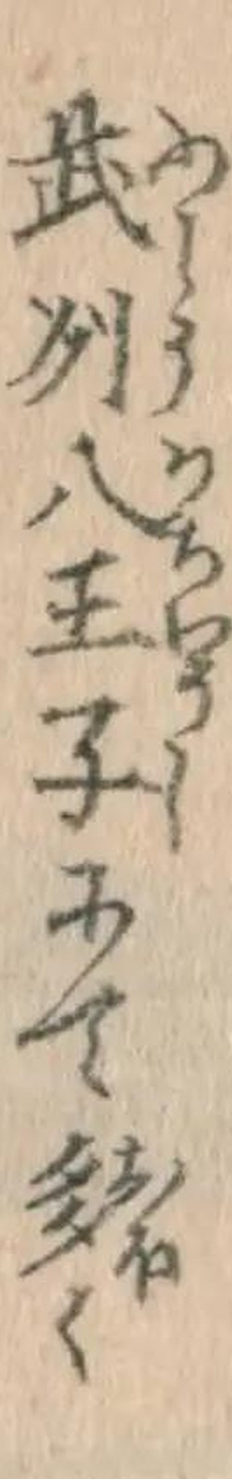武州八王子にて多く
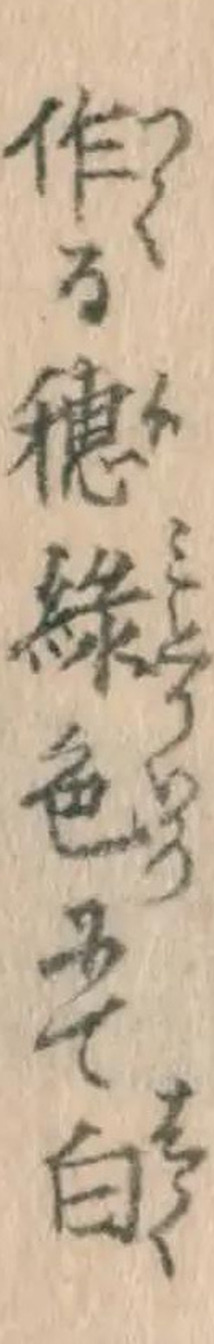作る穂緑色にて白
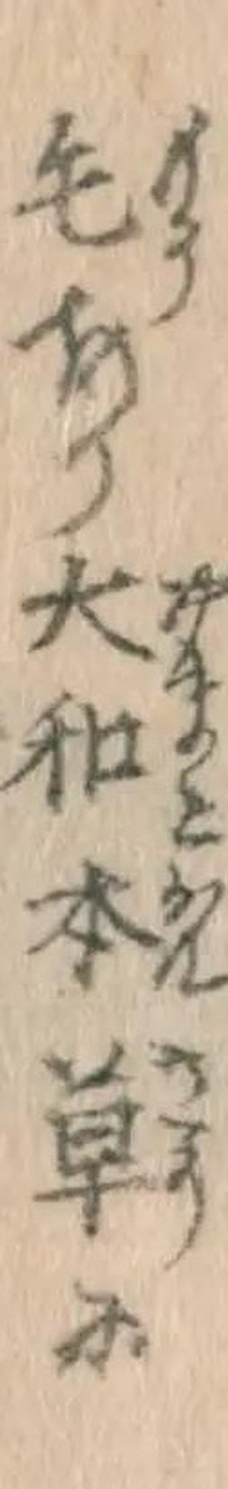毛あり大和本草に
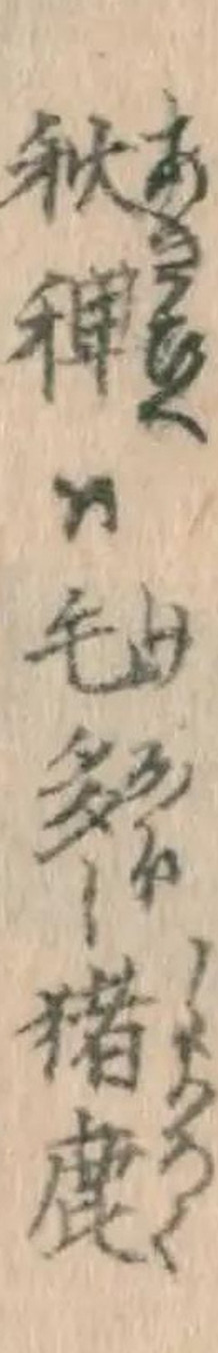秋稗は毛多し猪鹿
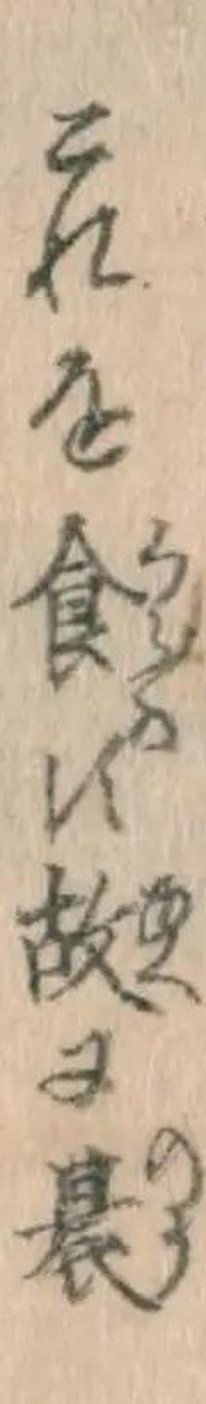これを食す故に農
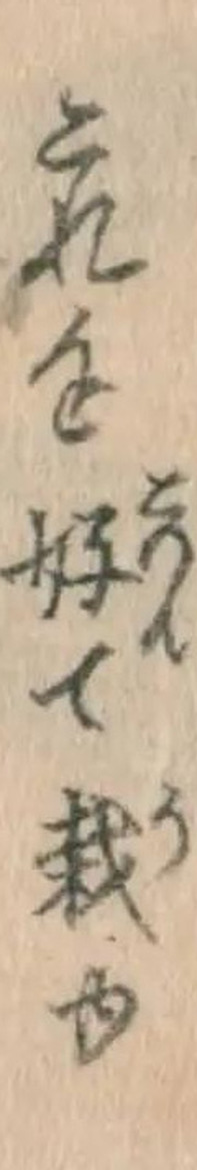これを好て栽ゆ
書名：本草図譜. 巻40-42
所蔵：国立国会図書館 National Diet Library, JAPAN
